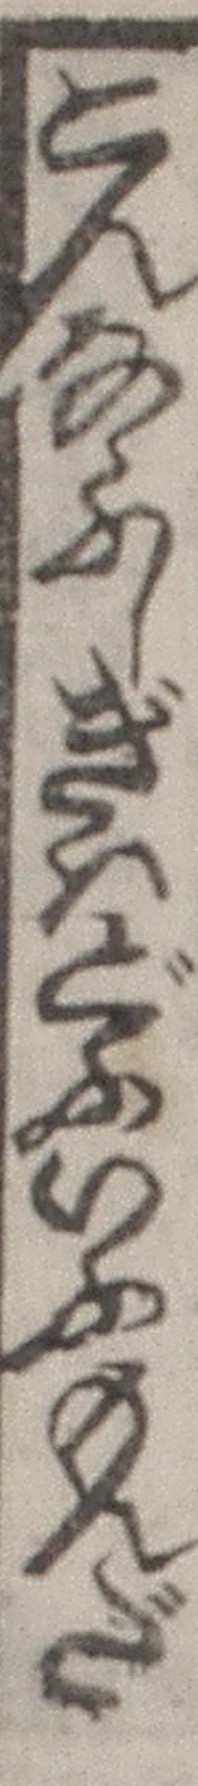こんなふしぎはどふいふもんだ
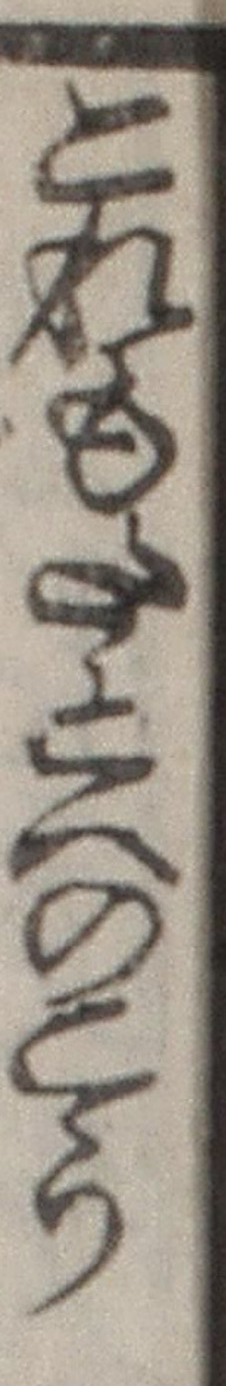これもたとへのこう
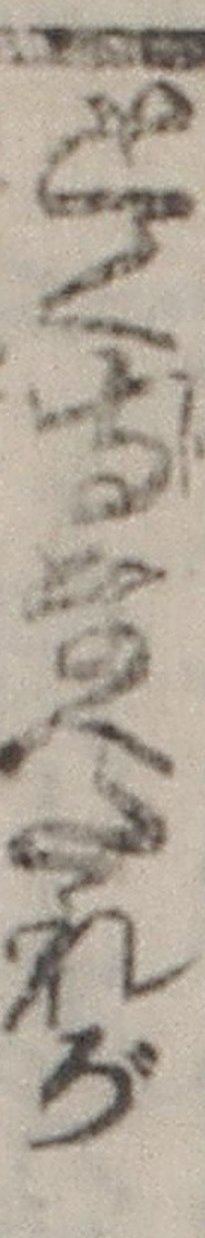とく寺まへたれが
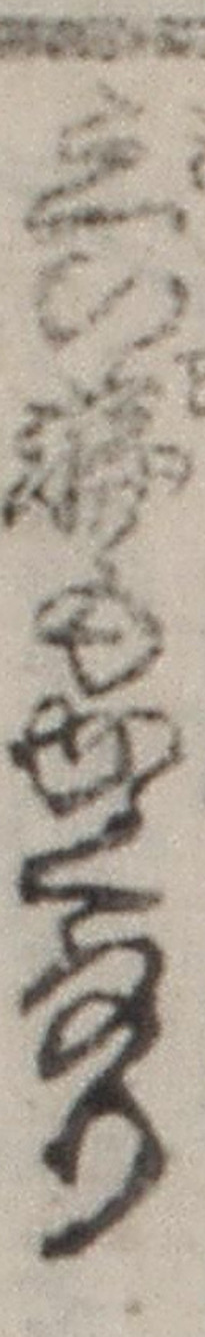三の輪もかくなり
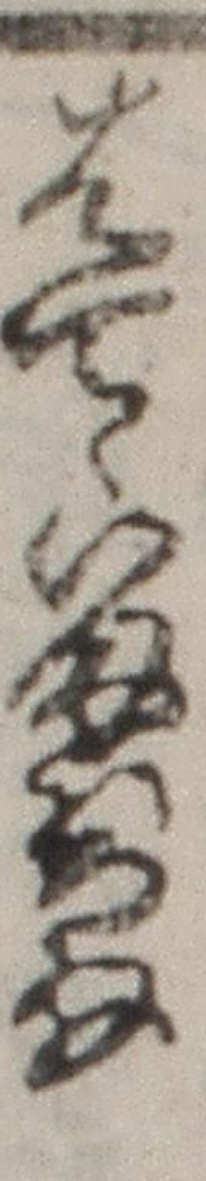はてゝいまはか？な
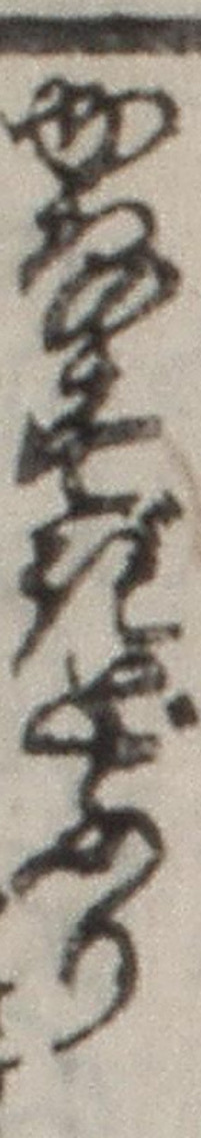かなすぎどふり
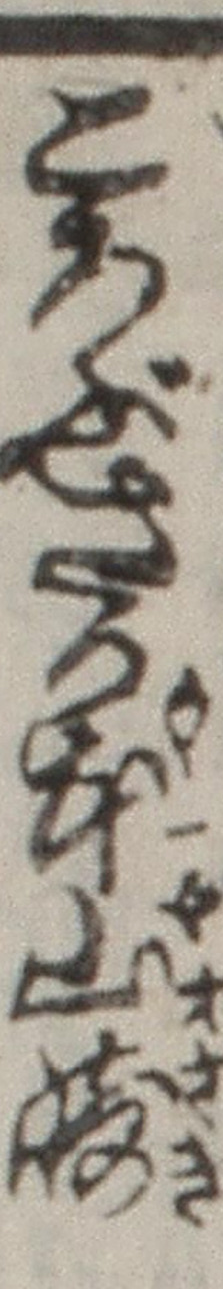ころぶさか本山崎
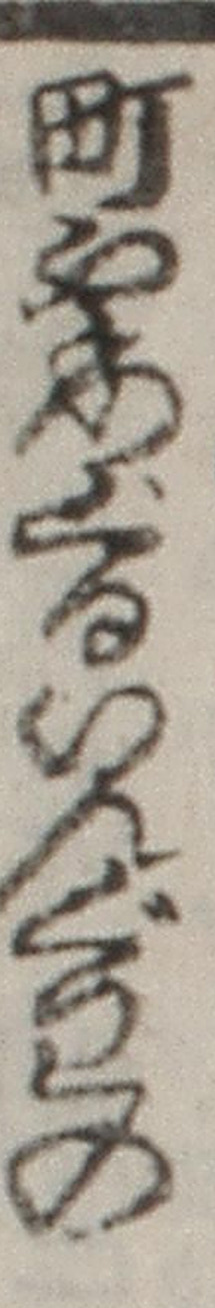町やめぐるいんぐわの
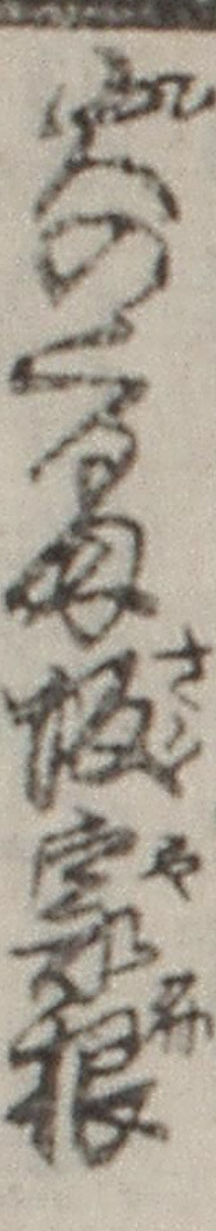火のくるま坂家根
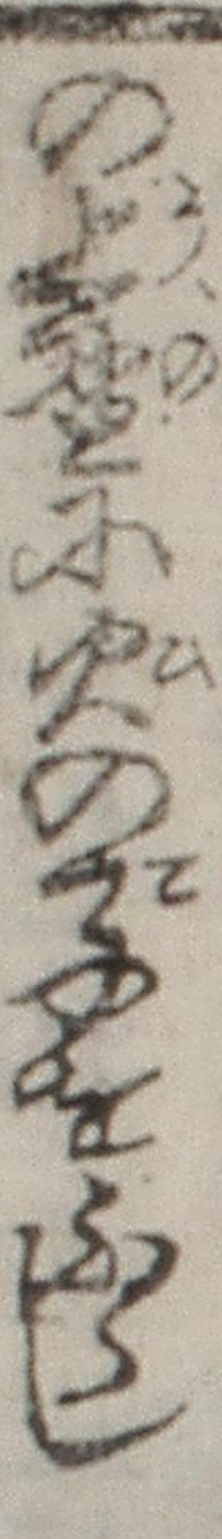の上野に火の子をふらし
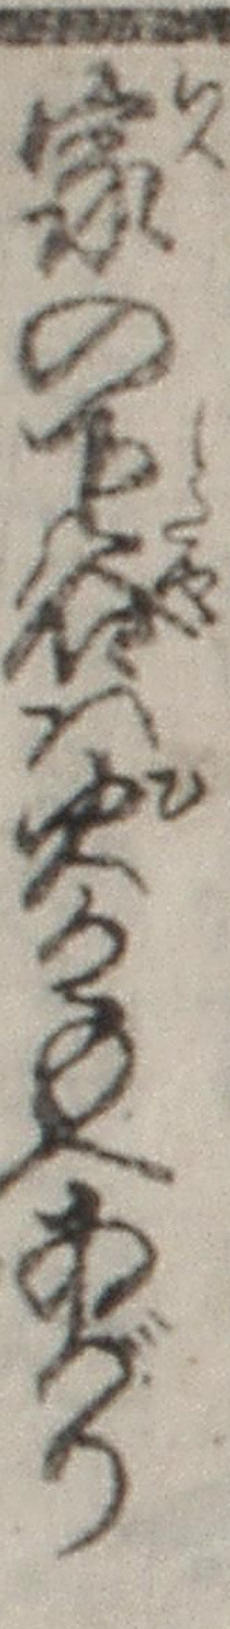家の下谷は火かもへあがり
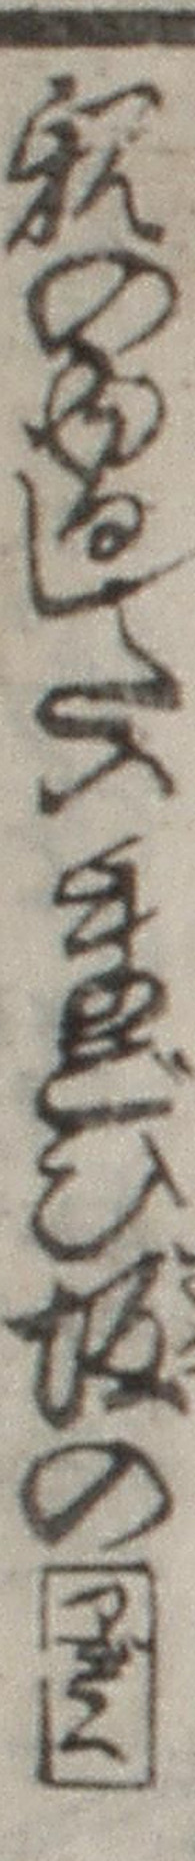親のゆるしたつまごひ坂のつぎへ

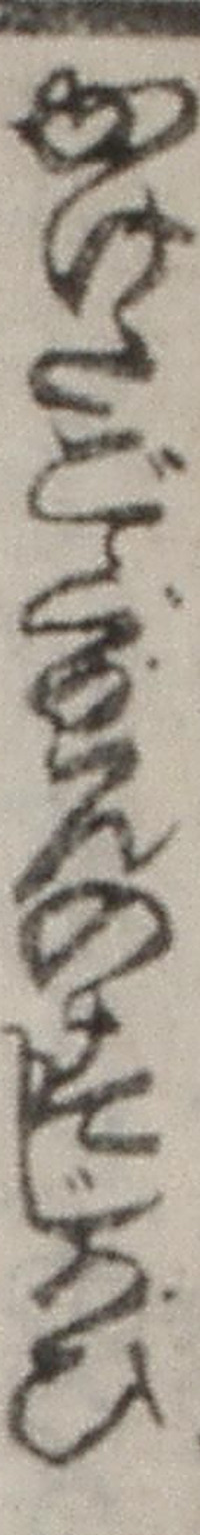かけたごゑんのすじかひ
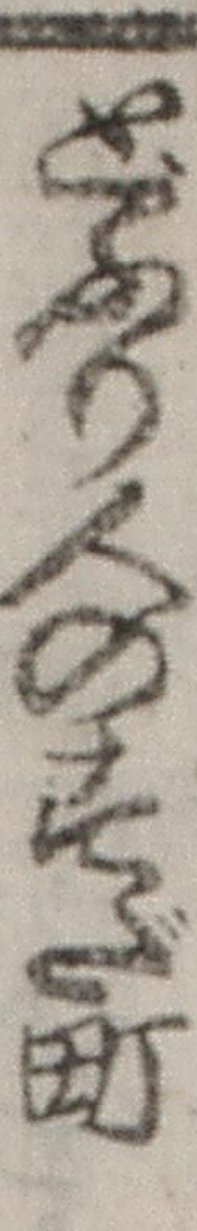どふり人のすだ町
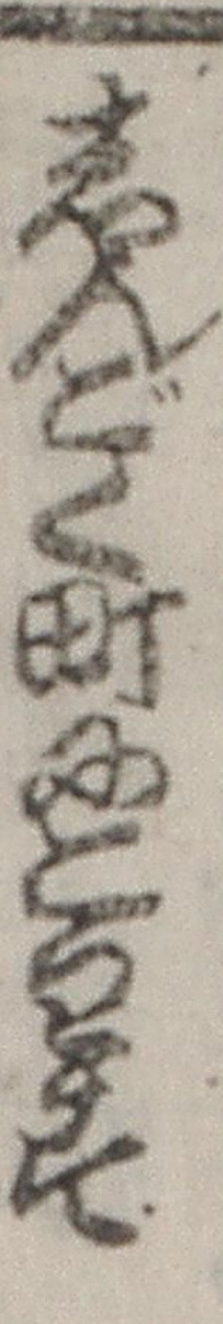しんごく町にこわす
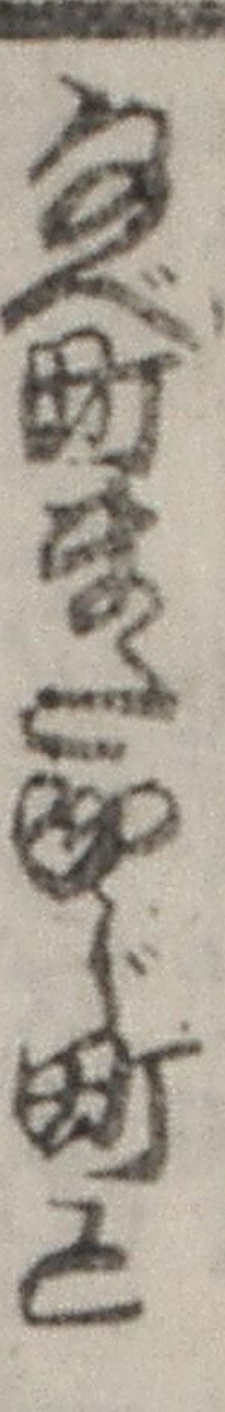なべ町またかじ町と
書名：安政二卯年　江戸大地震并出火附
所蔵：東京大学地震研究所図書室 Earthquake Research Institute Library, The University of Tokyo, JAPAN
